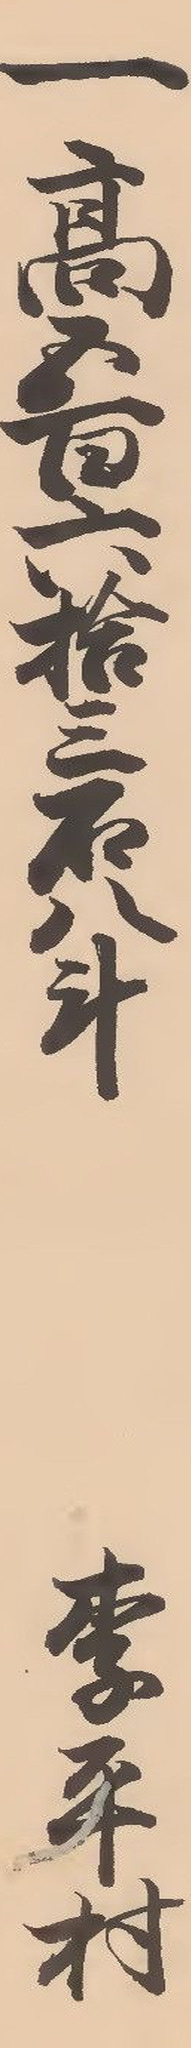一高五百六拾三石八斗李平村
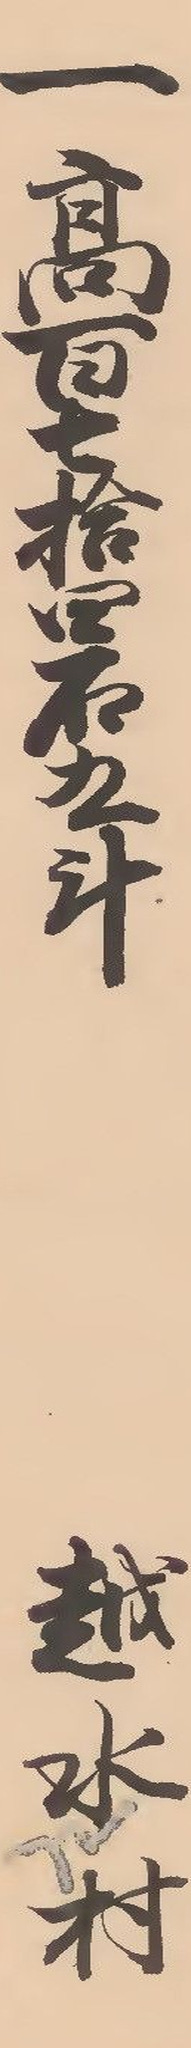一高百七拾四石九斗越水村

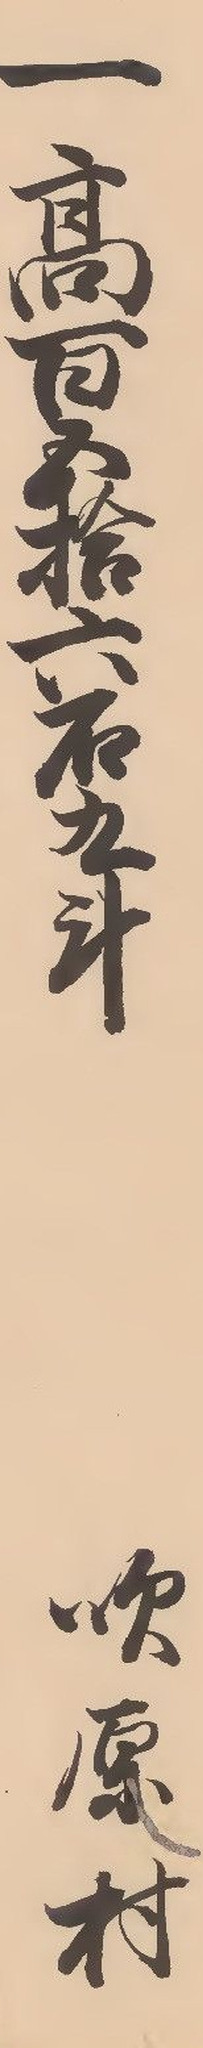一高百五拾六石九斗吹原村
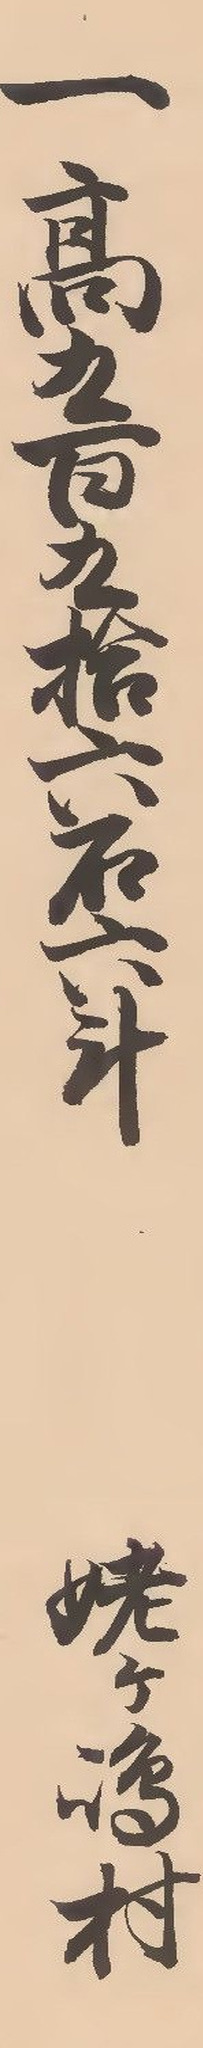一高九百九拾六石六斗姥ヶ島村
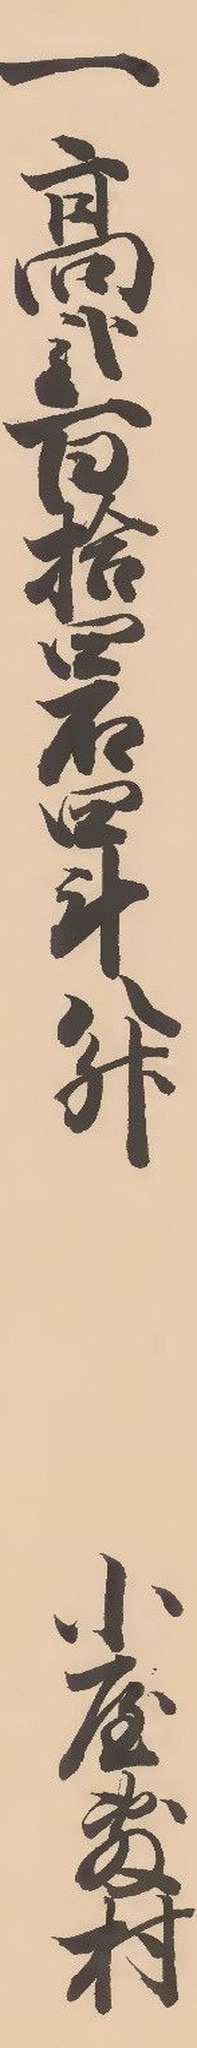一高弐百拾四石四斗八升小屋敷村
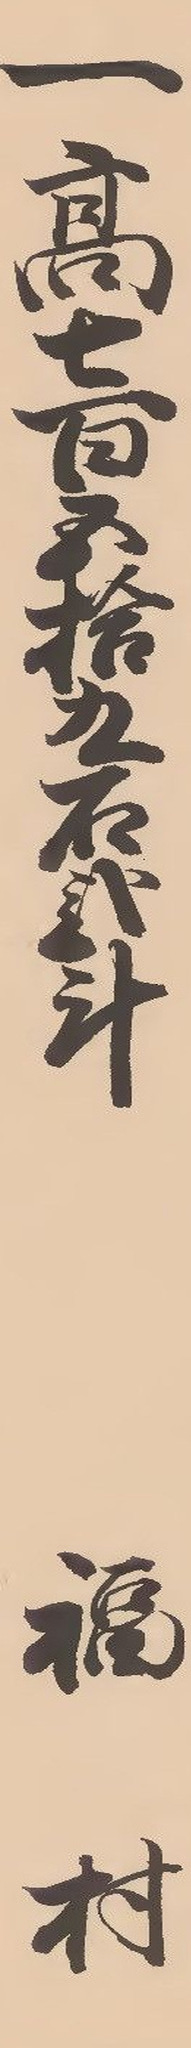一高七百五拾九石弐斗福村
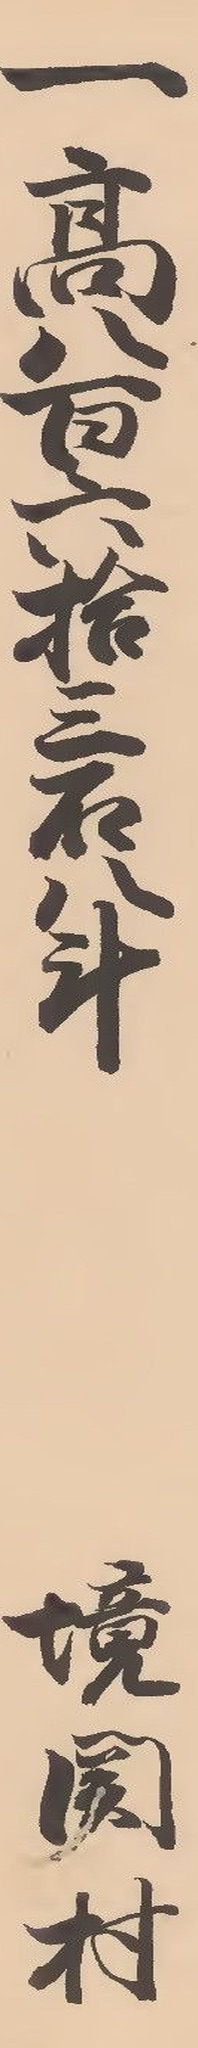一高八百六拾三石八斗境関村
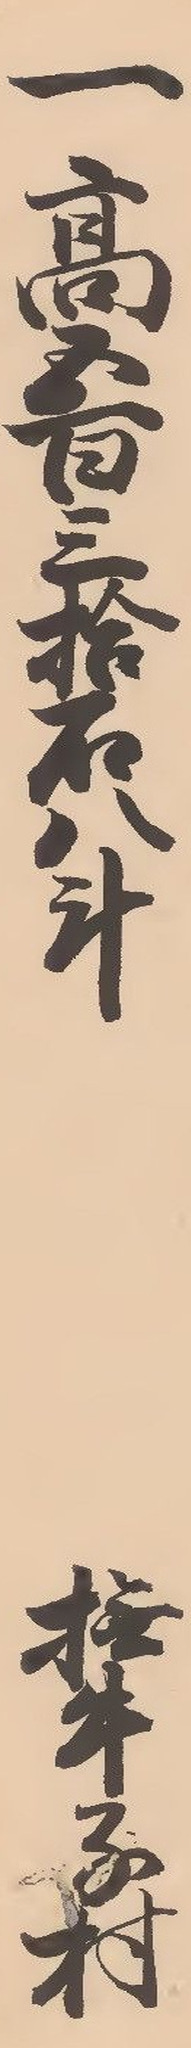一高五百三拾石八斗撫牛子村

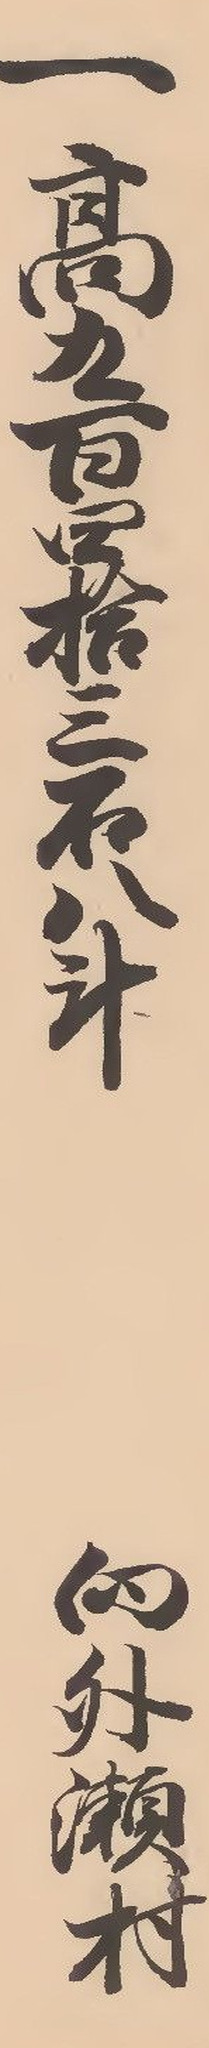一高九百四拾三石八斗向外瀬村
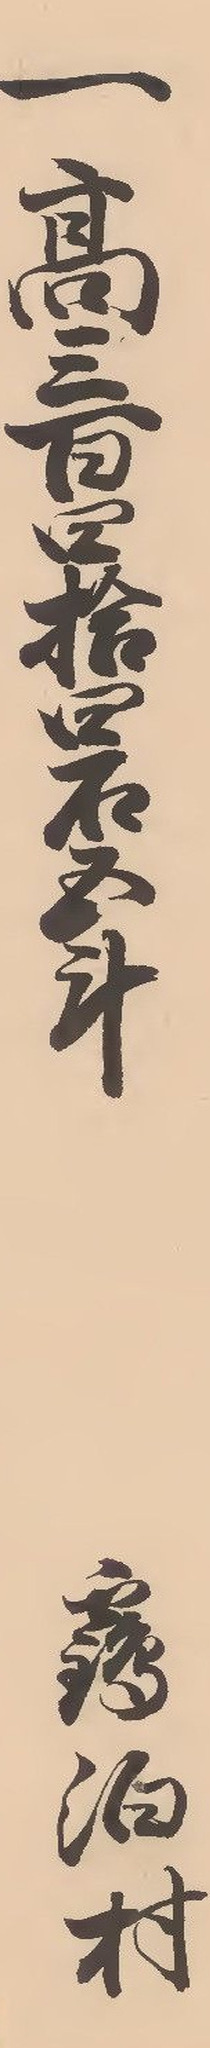一高三百四拾四石五斗鶴泊村
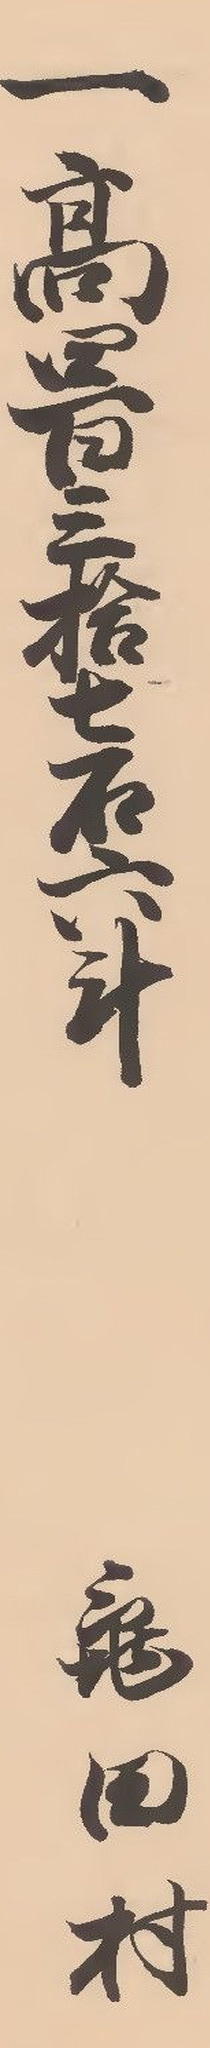一高四百三拾七石六斗亀田村
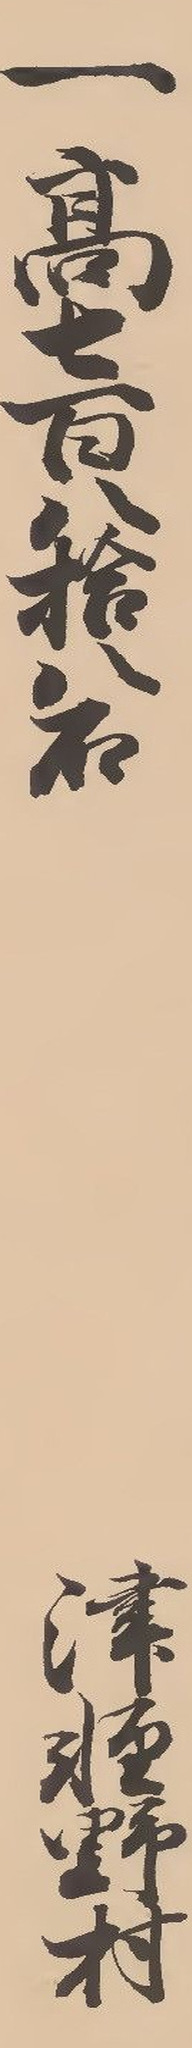一高七百八拾八石津軽野村
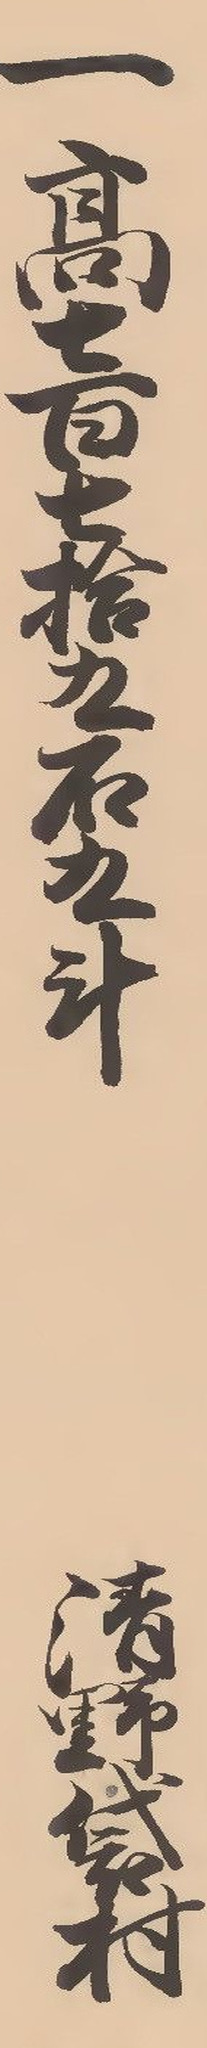一高七百七拾九石九斗清野袋村
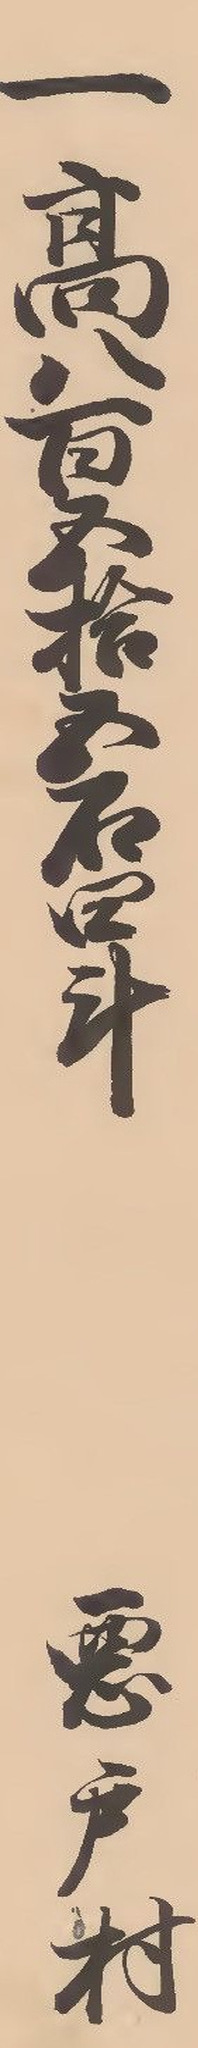一高八百五拾五石四斗悪戸村

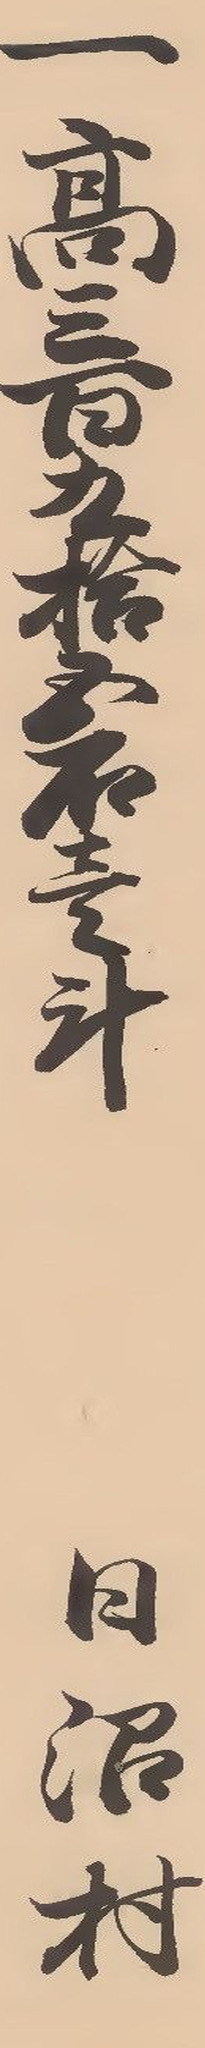一高三百九拾五石壱斗日沼村
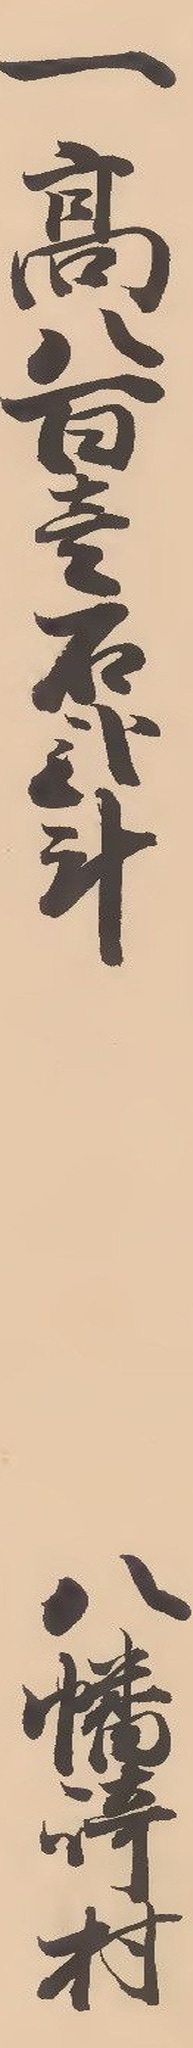一高八百壱石弐斗八幡崎村
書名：陸奥国郷帳　７
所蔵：国立公文書館 National Archives of Japan
